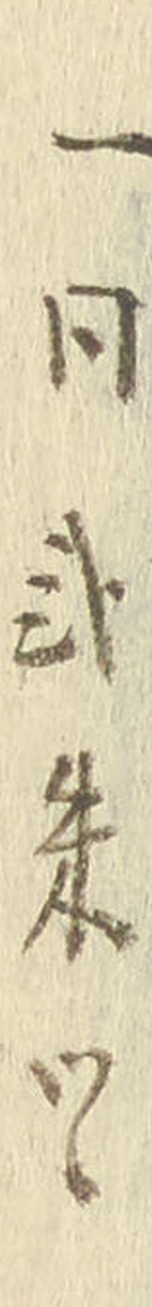一同弐朱ツヽ
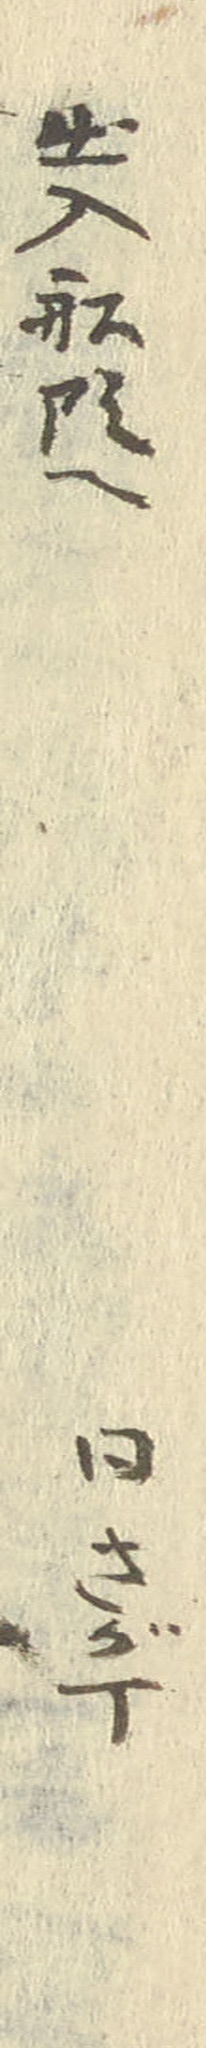出入船頭へ同さが丁
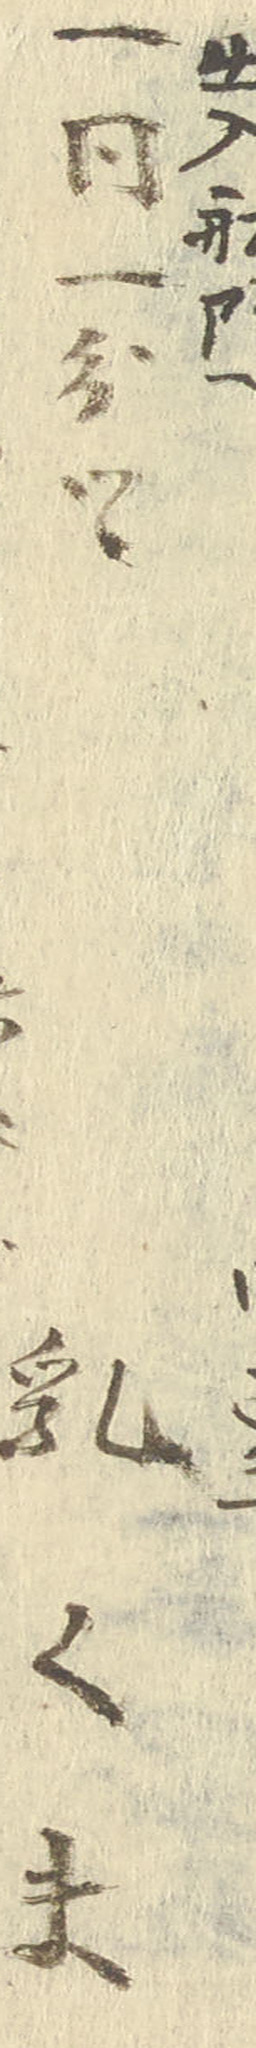一同一分ツヽ乳くま
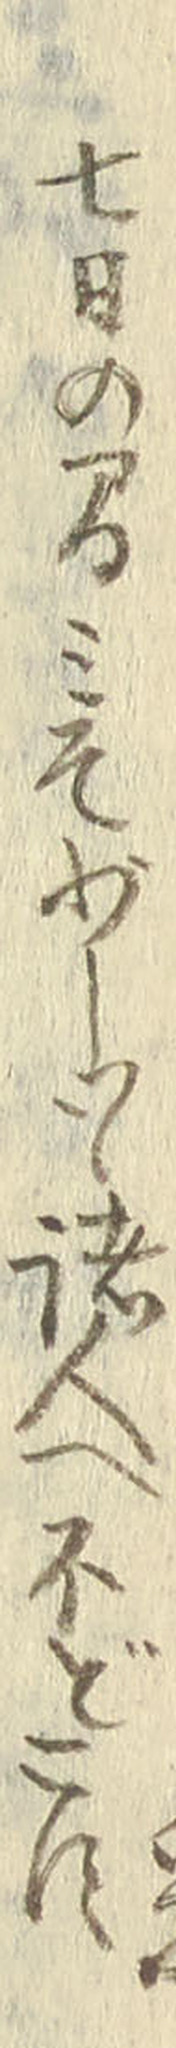七日の間ミそ少しツヽ諸人へほどこす
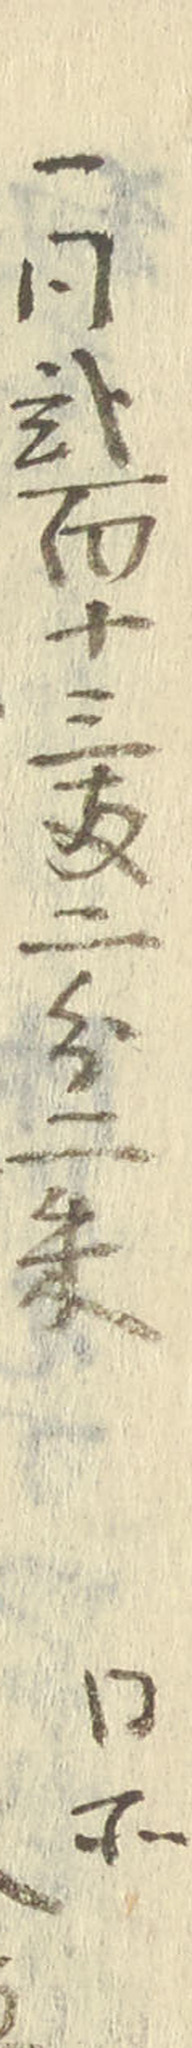一同弐百十三両二分二朱同所
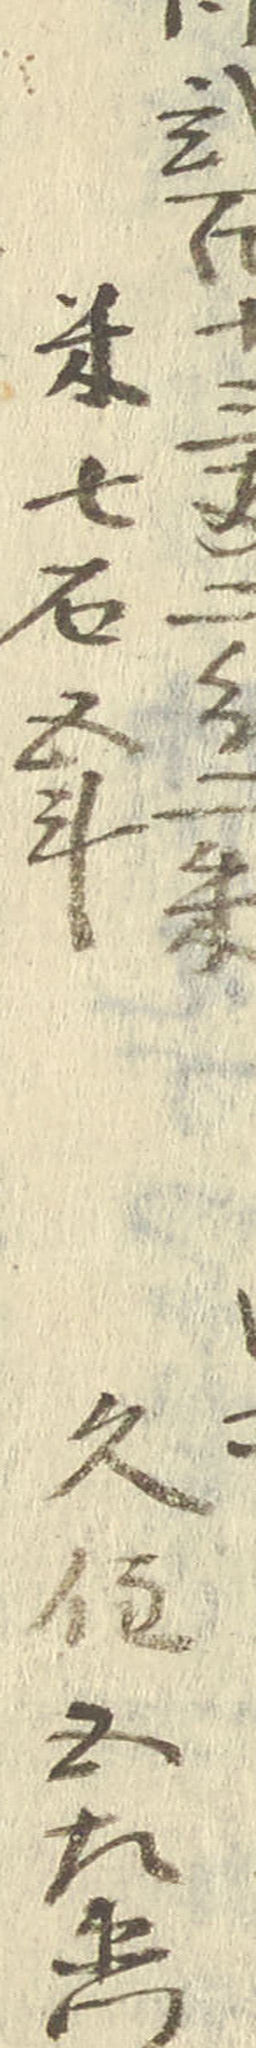米七石五斗久住五左衛門
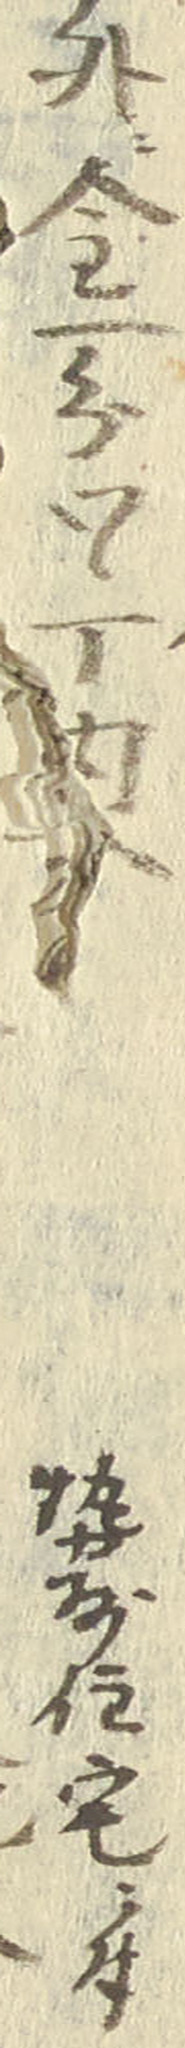外ニ金一分ツヽ丁内へ勢州住宅ニ付
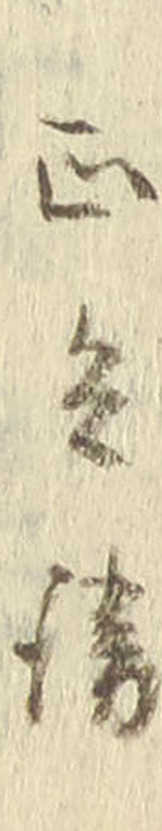正兵衛
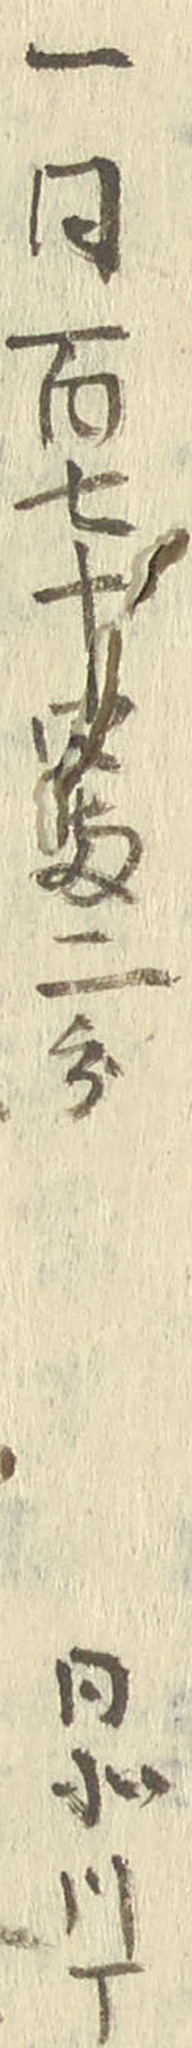一同百七十四両二分同北小川丁
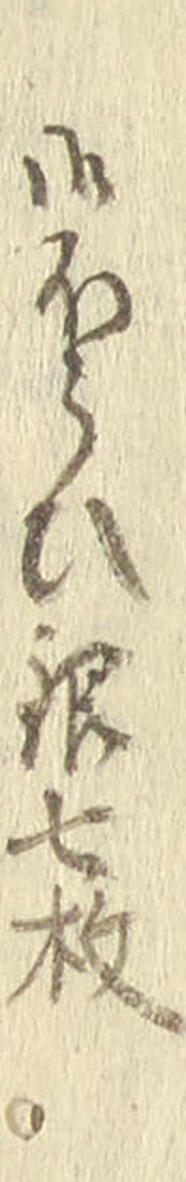御ほうひ銀七枚
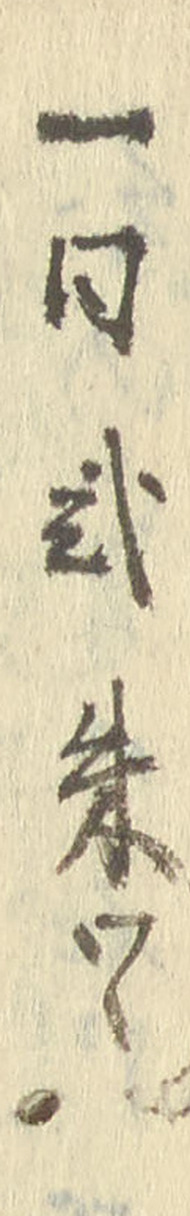一同弐朱ツヽ
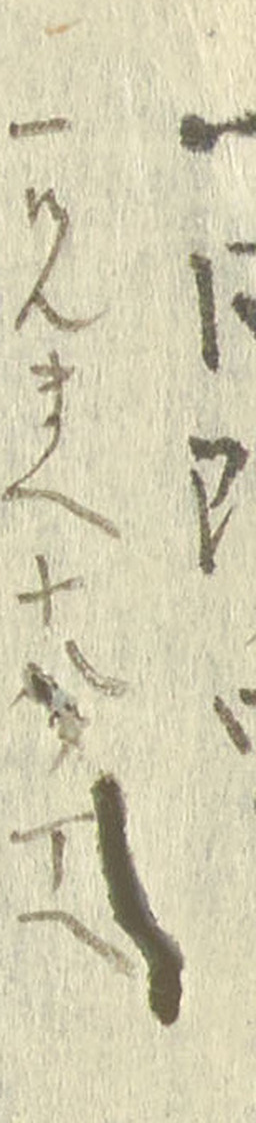一けんまへ同さが丁

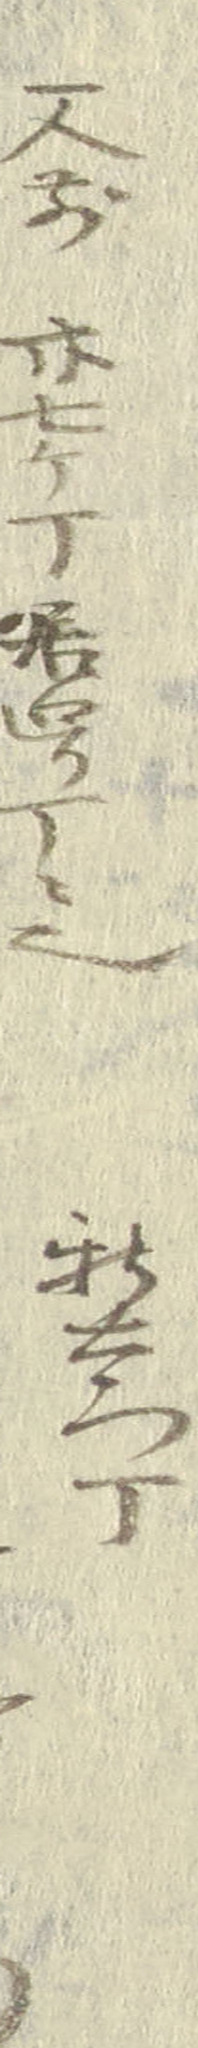一人前廿七ヶ丁居廻り丁〻也新右衛門丁
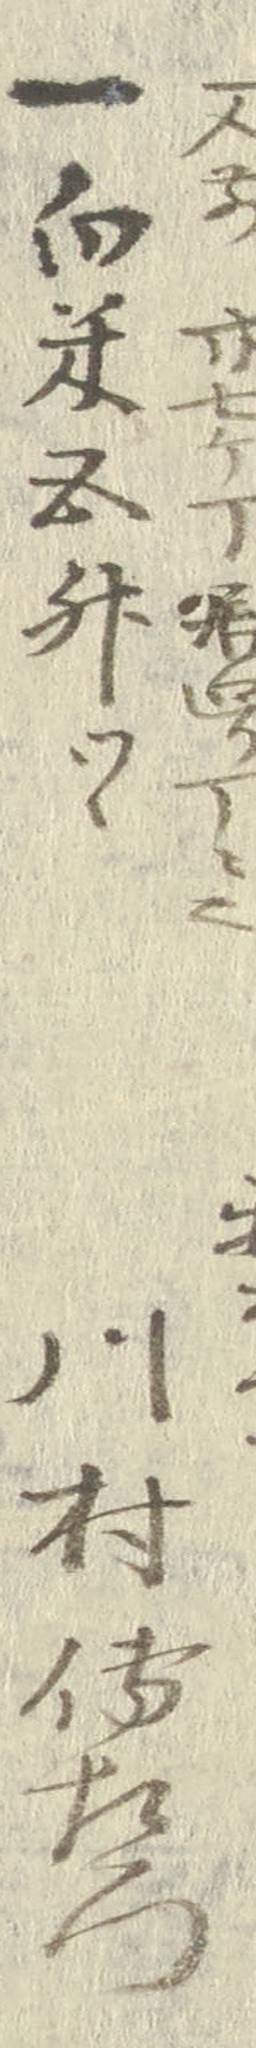一白米五升ツヽ川村傳左衛門
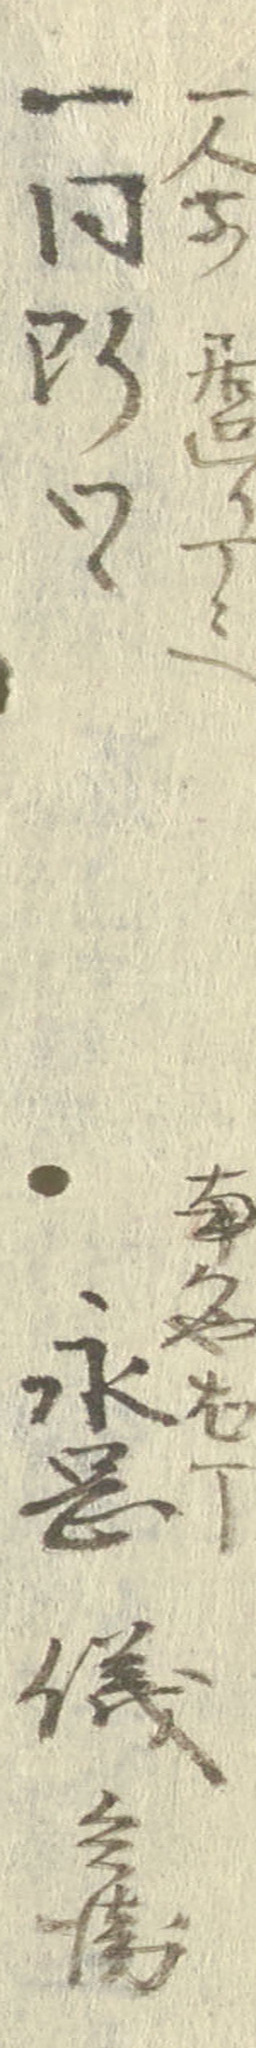一同断ツヽ永岡儀兵衛
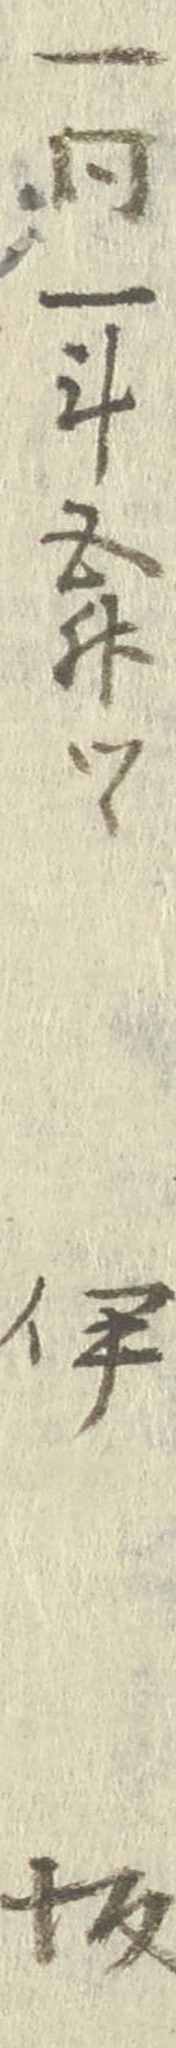一同一斗五升ツヽ伊坂
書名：御府内御屋敷方市中共地震類焼場所明細書之冩兼街道筋近郷聞書
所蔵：東京大学総合図書館 General Library in the University of Tokyo, JAPAN
